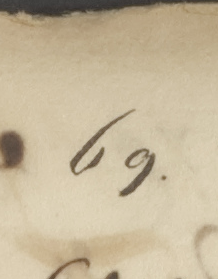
69.
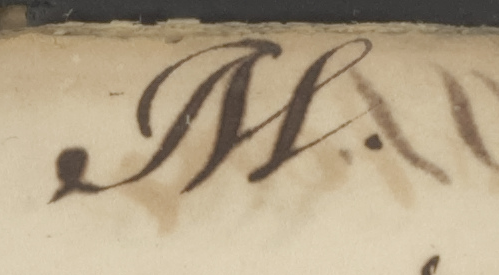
M.
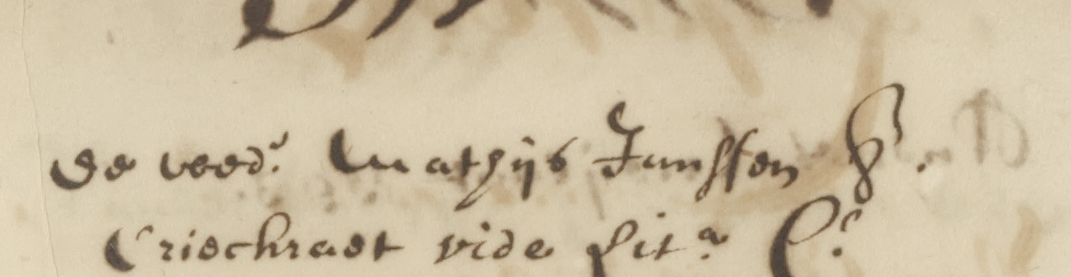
De wede. Mathijs Janssen &
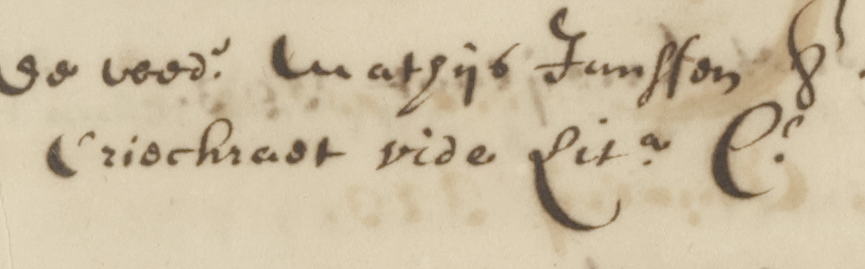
Crieckraet vide Lita. C.
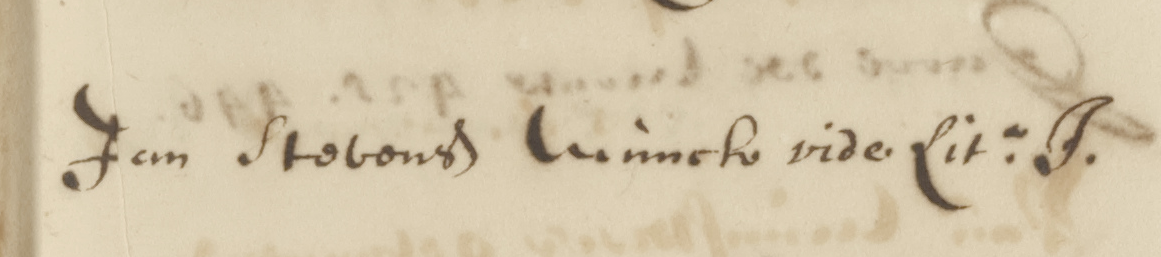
Jan Stevens Munck vide Lita. J.
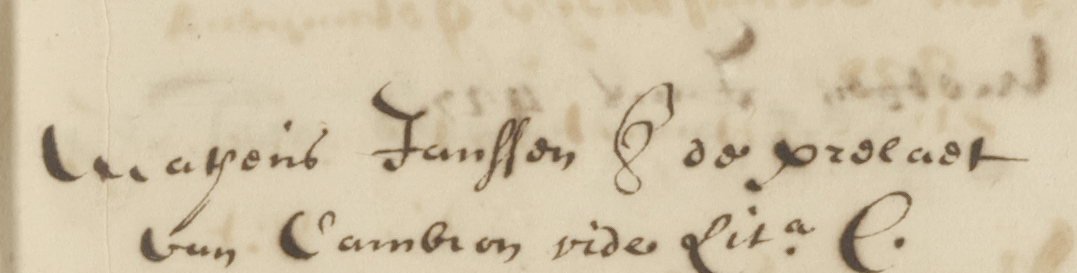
Matheus Janssen & de prelaet
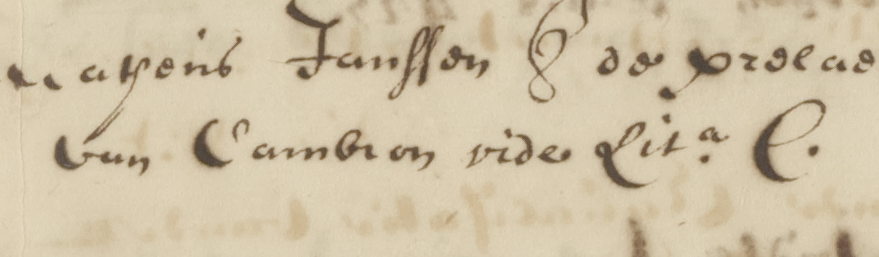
van Cambion vide Lita. C.
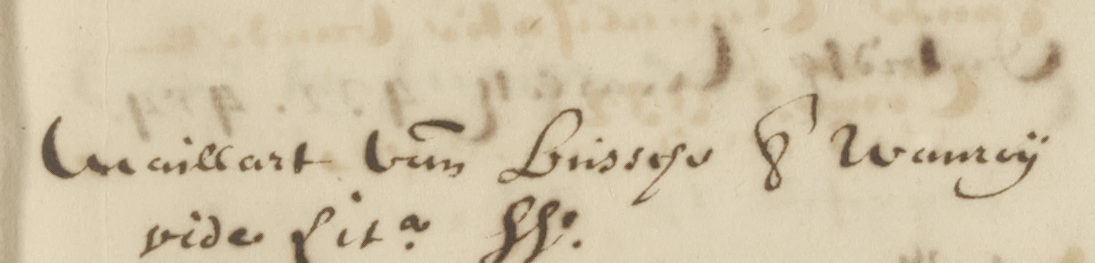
Maillart van Bussche & Wanroij
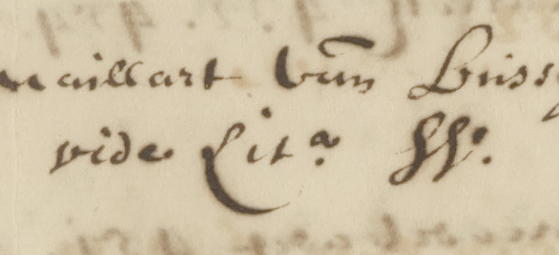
vide Lita. W.
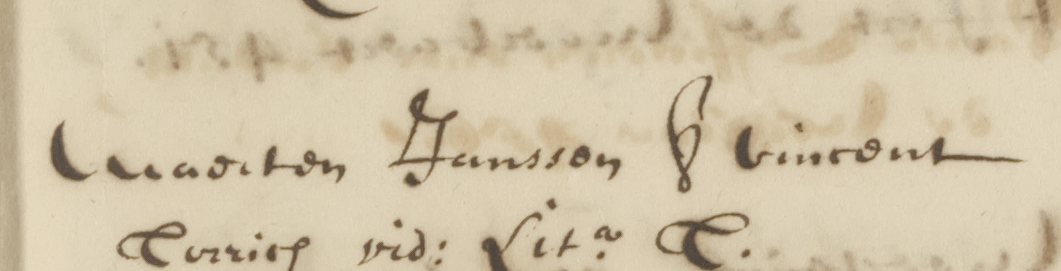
Maerten Janssen & Vincent
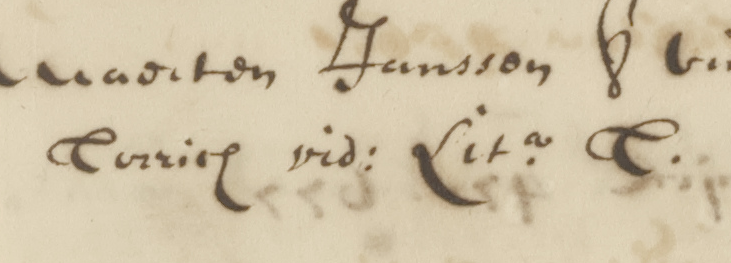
Torrich vid: Lita. T.
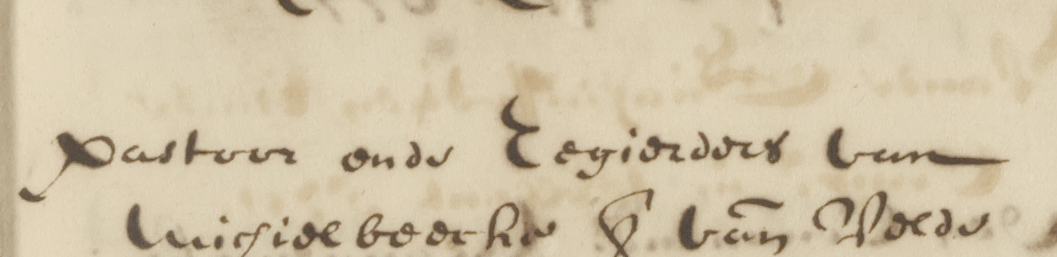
Pastoor ende Regierders van
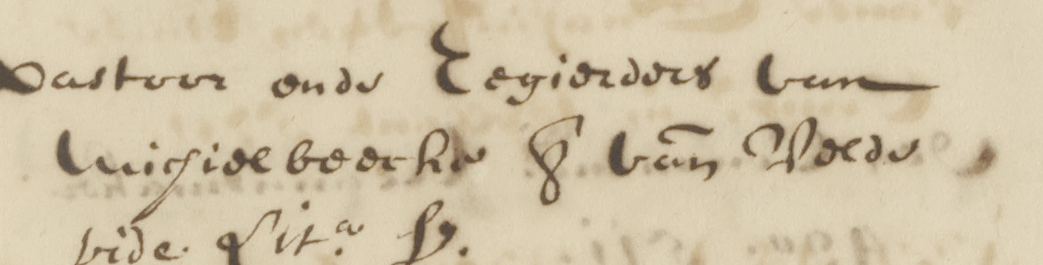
Michielbeecke & van Velde
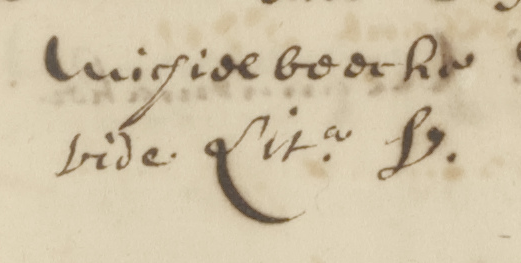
vide Lita. V
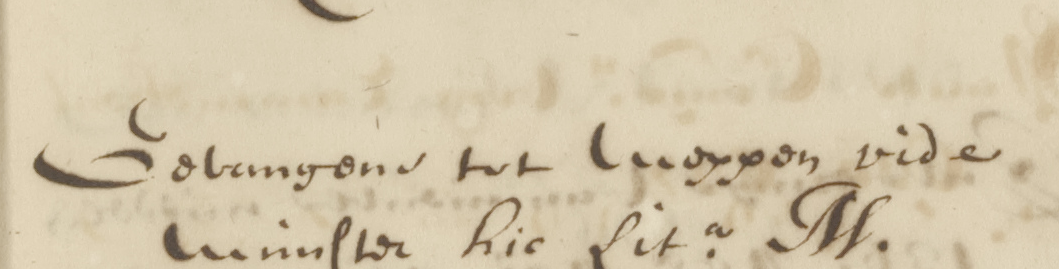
Gevangene tot Meppen vide
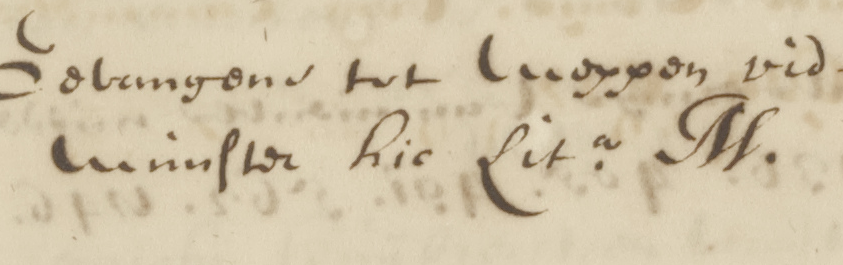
Munster hic Lita. M.
